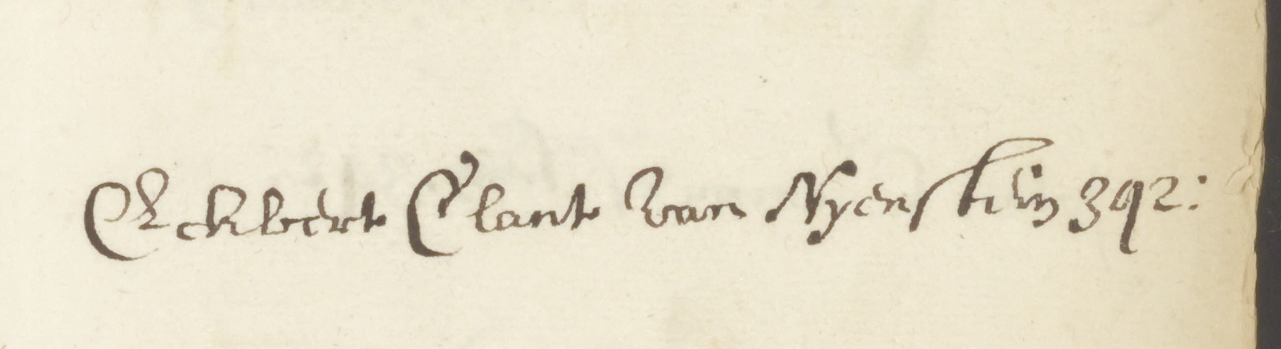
Eckbert Clant van Nyenstein 342:
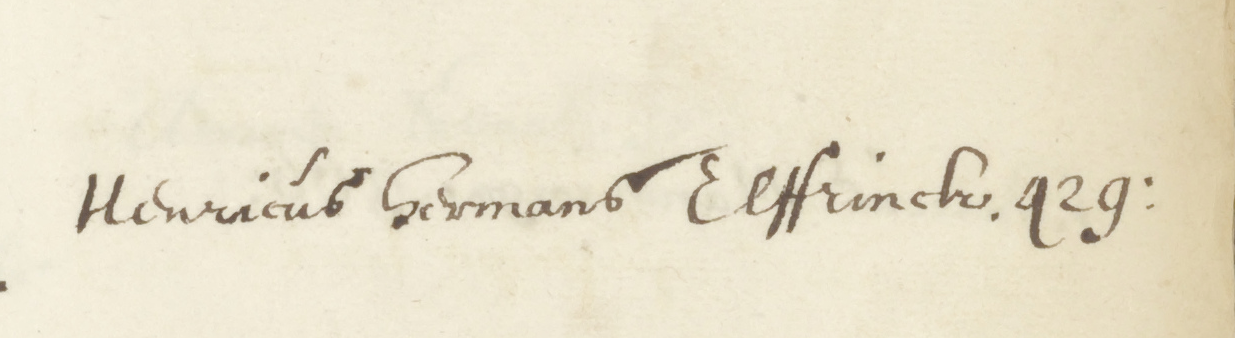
Henricus Hermans Elffrinck. 429:
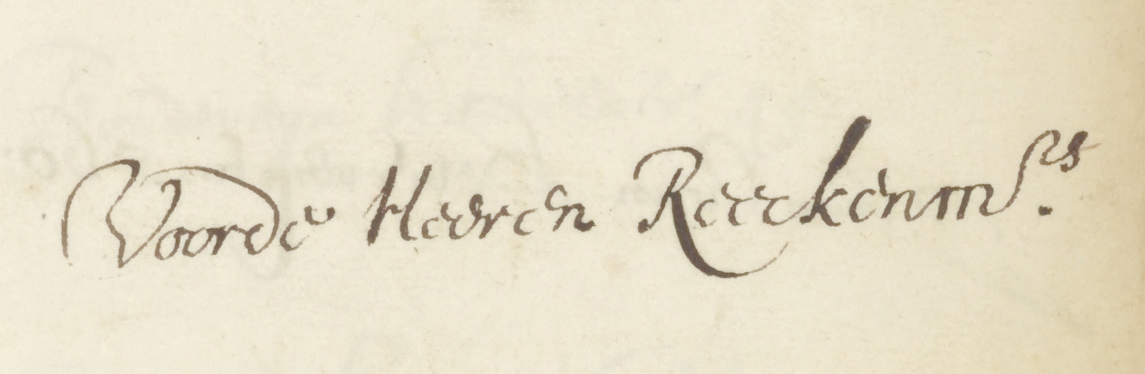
Voorde Heeren Reeckenmrs.
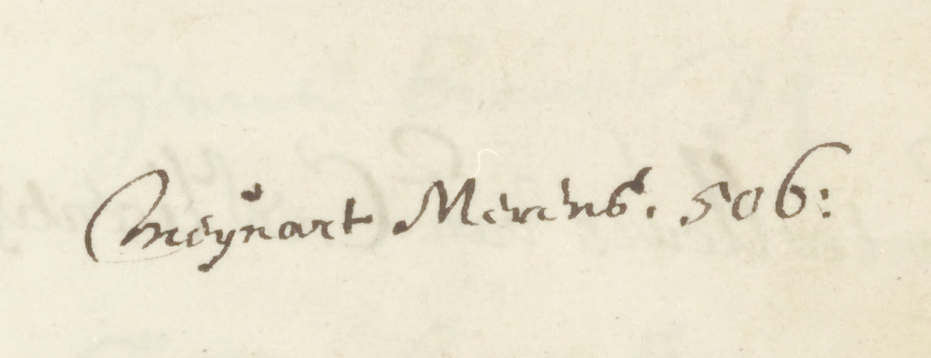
Meijnart Merens. 506:
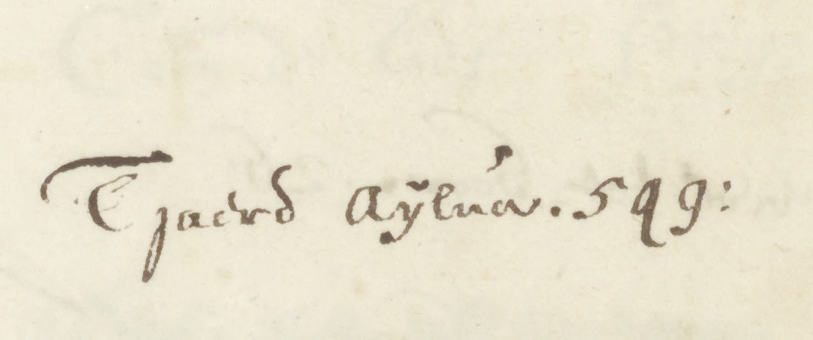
Tjaerd Aijlua. 549:
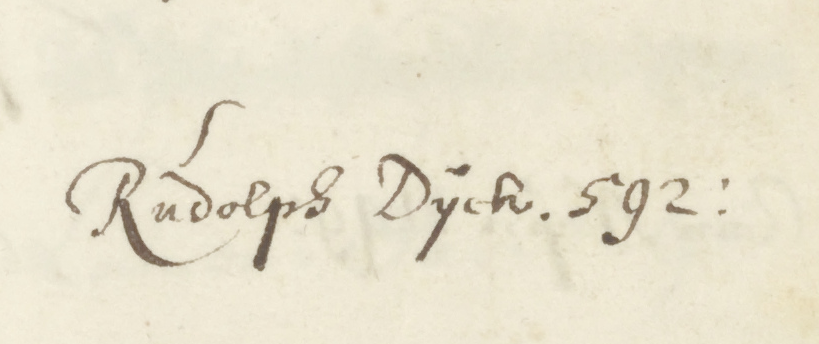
Rudolps Dijck. 592:
